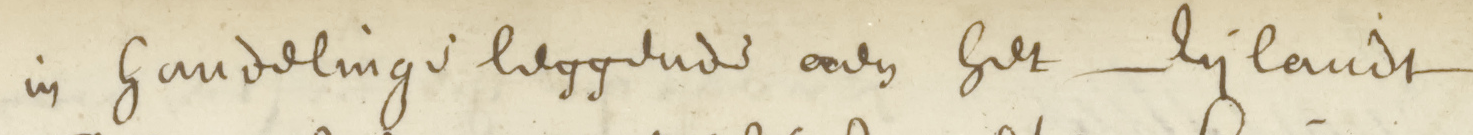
in handelinge leggende aen het Eijlandt
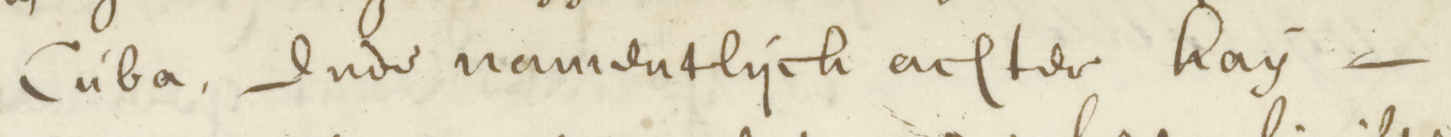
Cuba, ende namentlijck achter kaij —
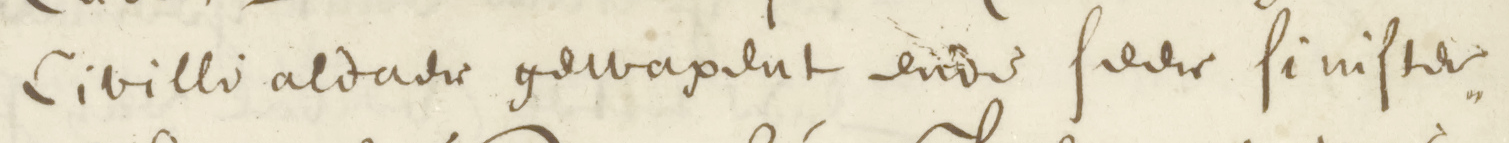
Civille aldaer gewapent ende seer sinister„
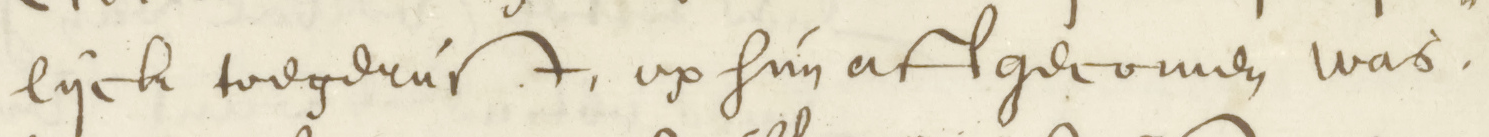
lijck toegerust, op hun affgecomen was,
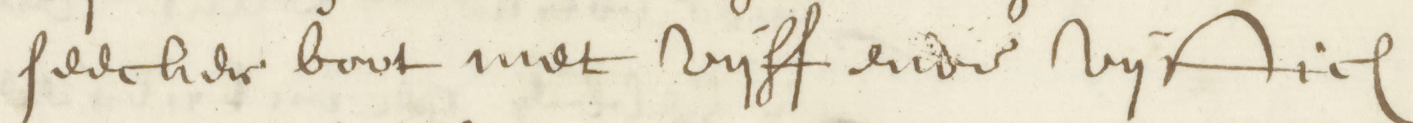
seecker boot met vijff ende vijftich
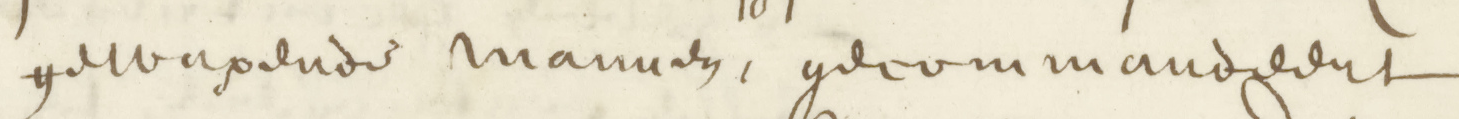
gewapende mannen, gecommandeert
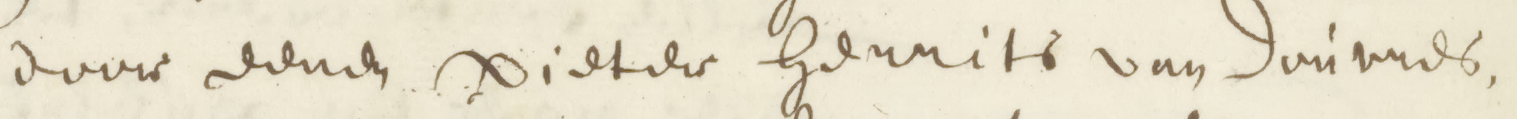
door eenen Pieter herrits van Douvres,
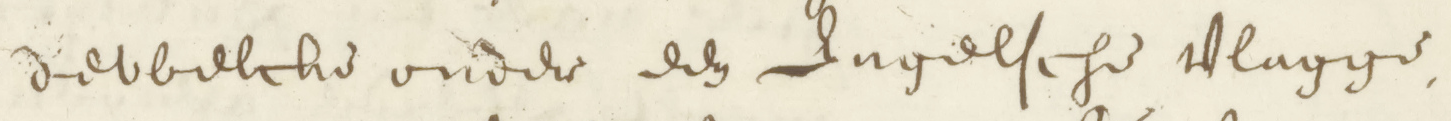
dewelcke onder een Engelsche Vlagge,
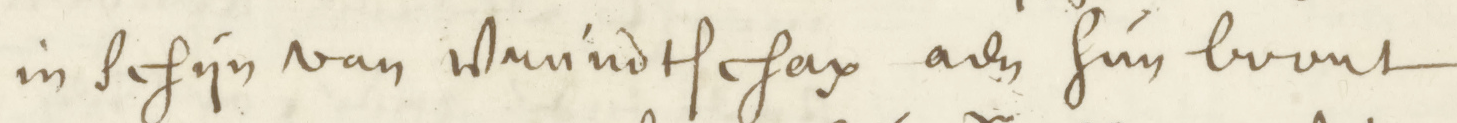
in schijn van Vrundtschap aen hun boort
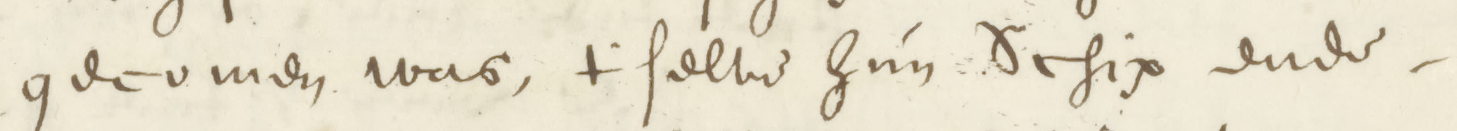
gecomen was, t'selve hun Schip ende
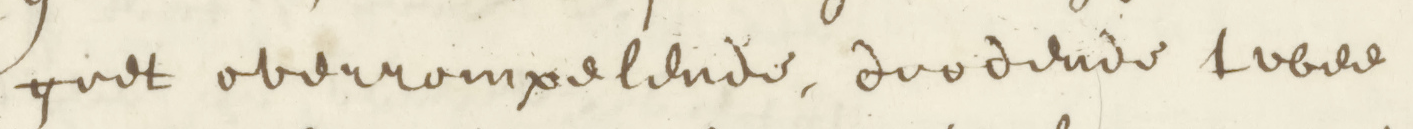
goet overrompelende, doodende twee
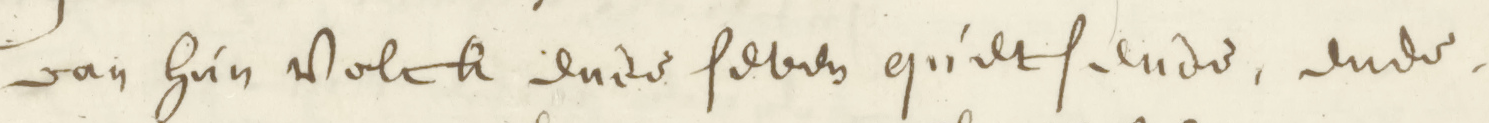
van hun Volck ende seven quetsende, ende
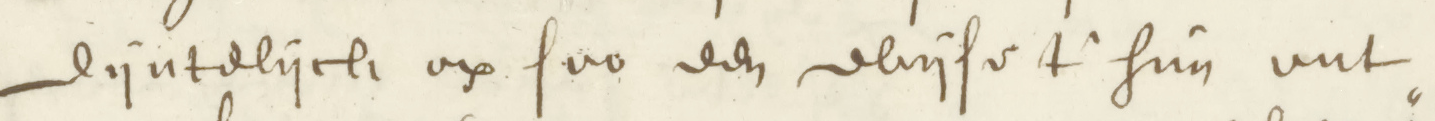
eijntelijck op soo een wijse t' hun ont„
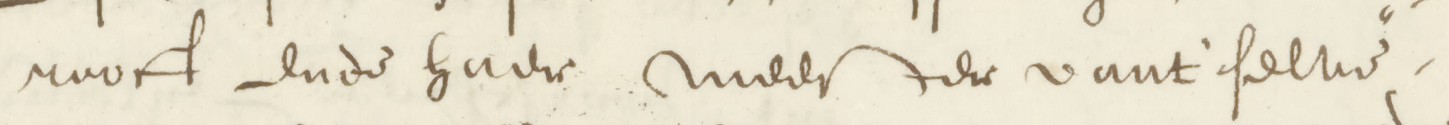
rooft ende haer meester vant' selve
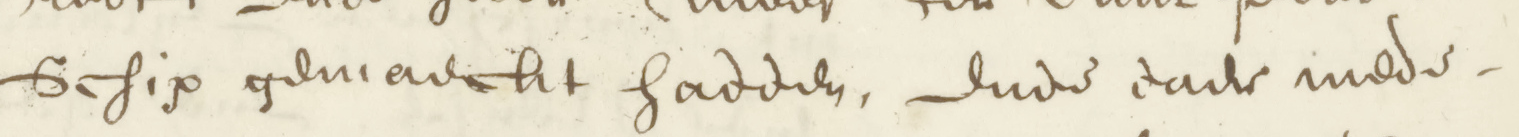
Schip gemaeckt hadden, ende daer mede
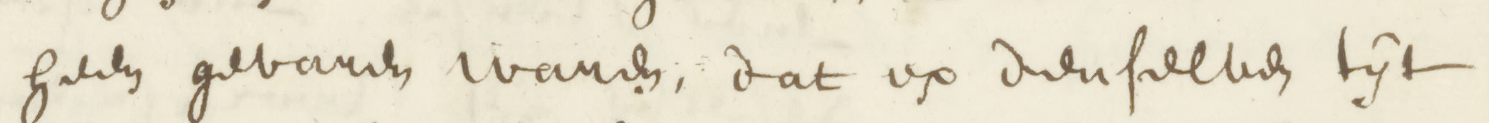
heen gevaren waren; dat op denselven tijt
